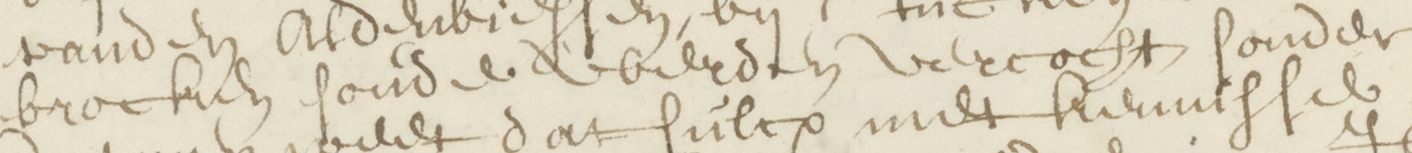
brocken soude werden vercocht, sonder
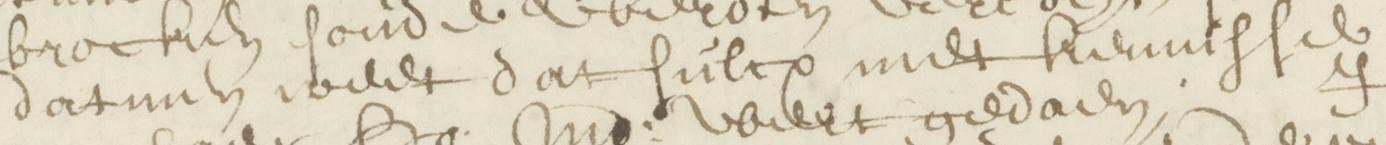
dat men weet dat sulcx met kennisse
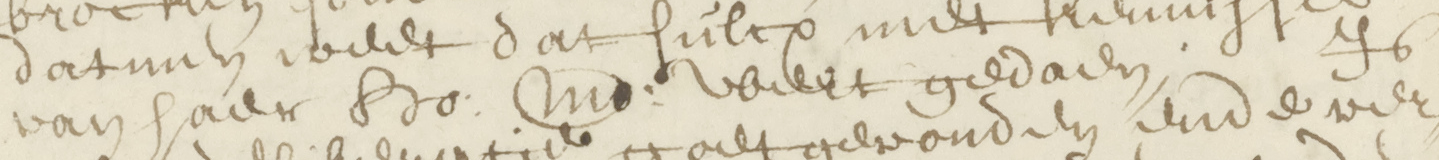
van haer Ho:Mo: wert gedaen; Is
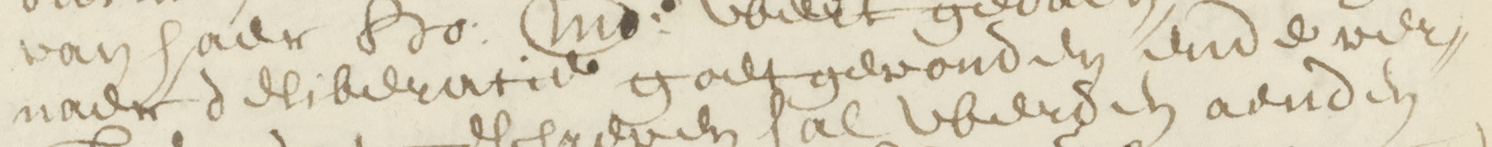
naer deliberatie goetgevonden ende ver,,
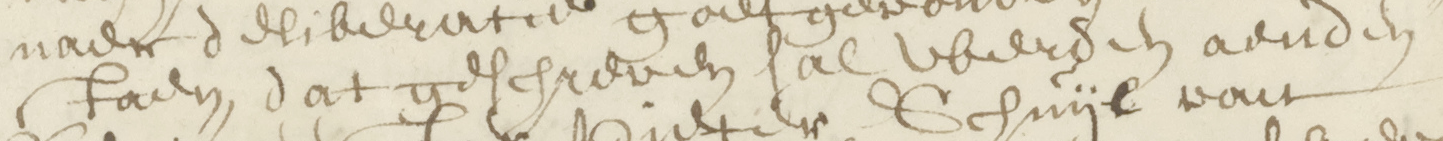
staen, dat geschreven sal werden aenden
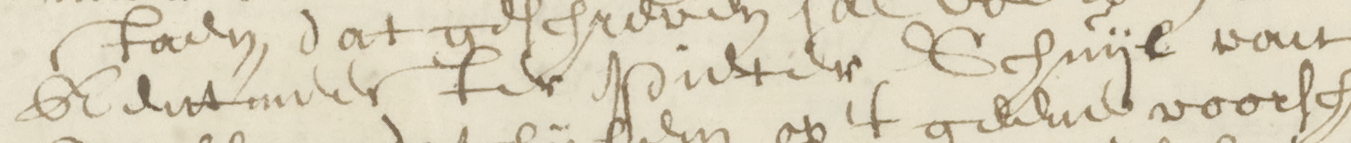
Rentmeester Pieter Schuijl van
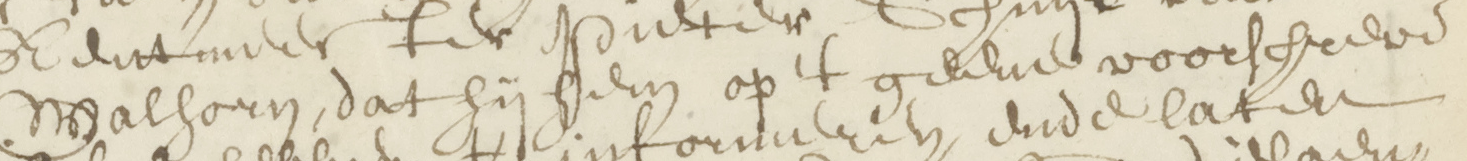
Walhorn, dat hij hem op 't geene voorschreve
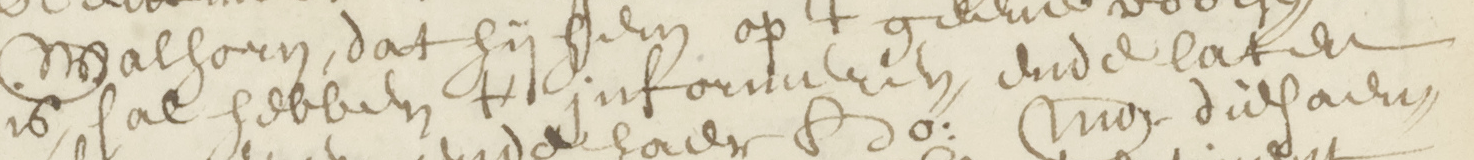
is, sal hebben t' informeren, ende laten
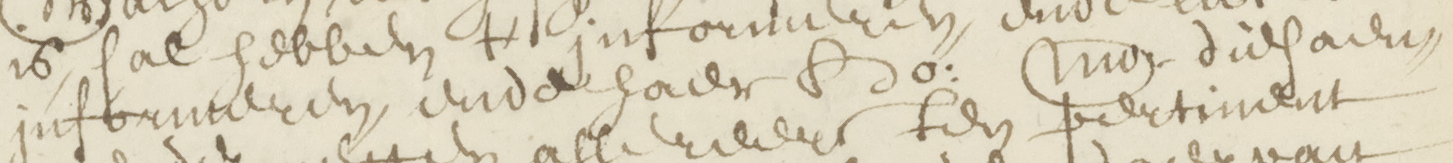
informeren, ende haer Ho:Mo: diesaen,,
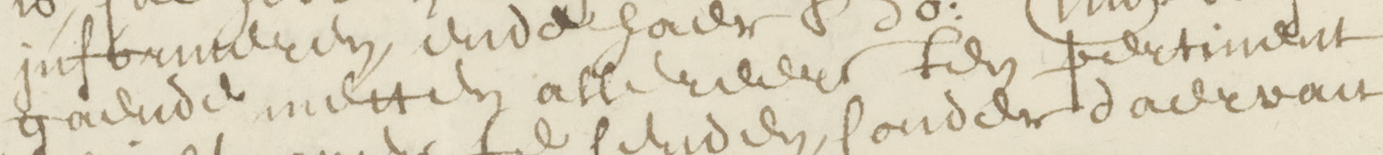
gaende metten allereersten pertinent
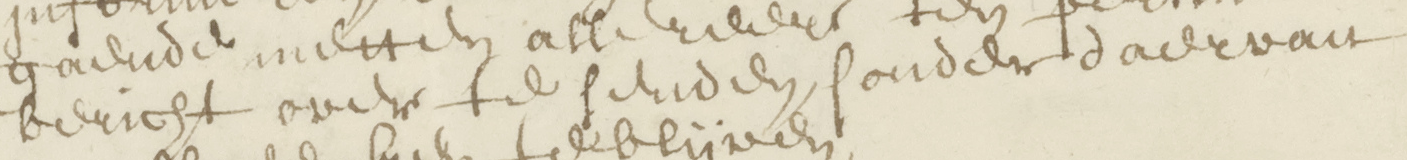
bericht over te senden, sonder daervan
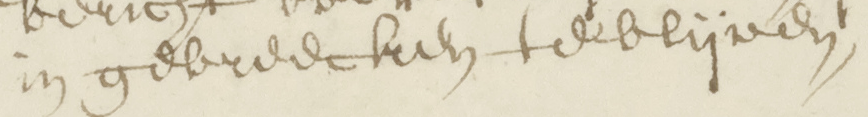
in gebreecken te blijven.
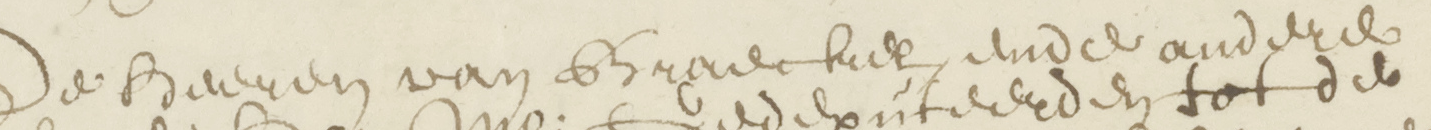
De heeren van Braeckel, ende andere
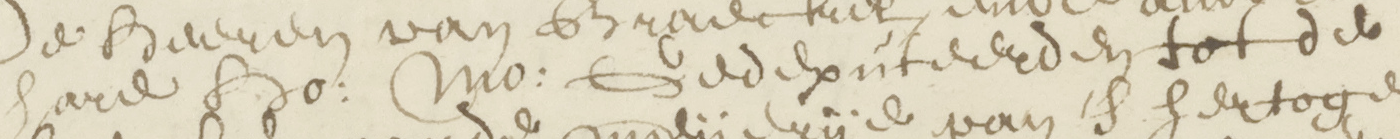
hare Ho:Mo: Gedeputeerden tot de
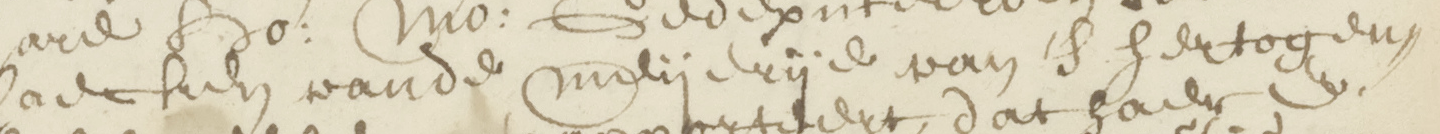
saecken vande meijerije van 's hertogen,,
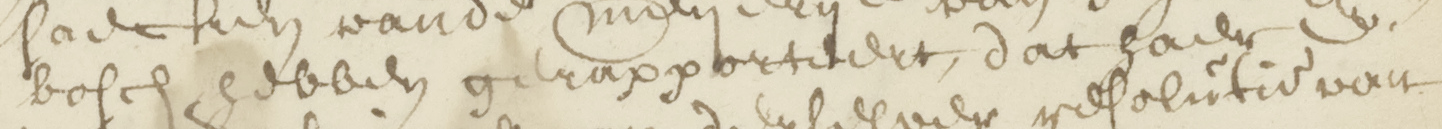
bosch, hebben gerapporteert, dat haer E.
